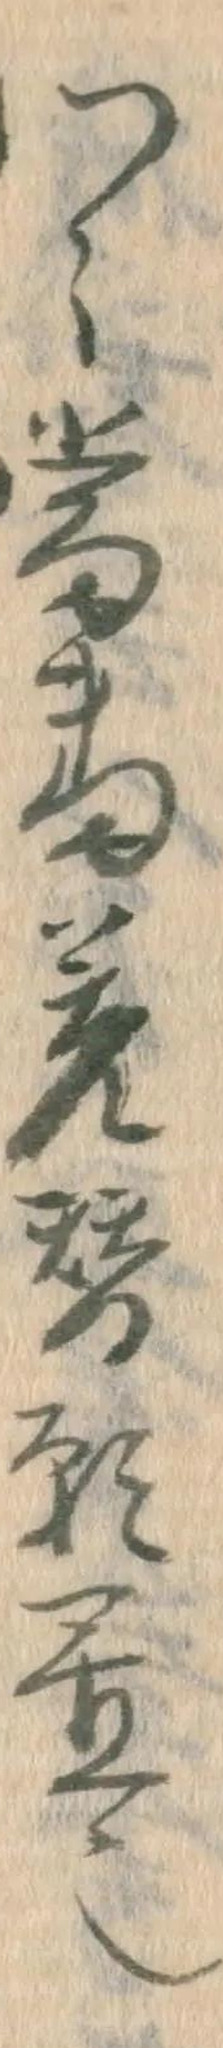門之當番差替願置也、
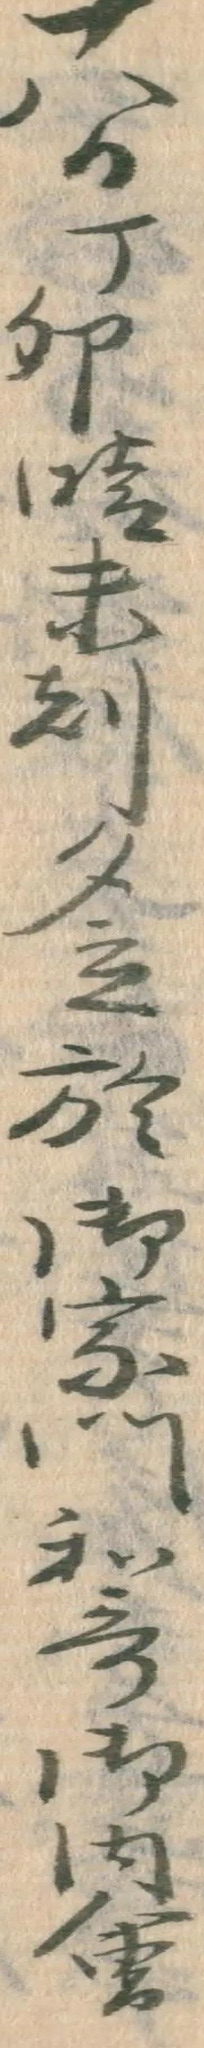十八日丁卯晴、未刻夕立、於御家門和歌御内會
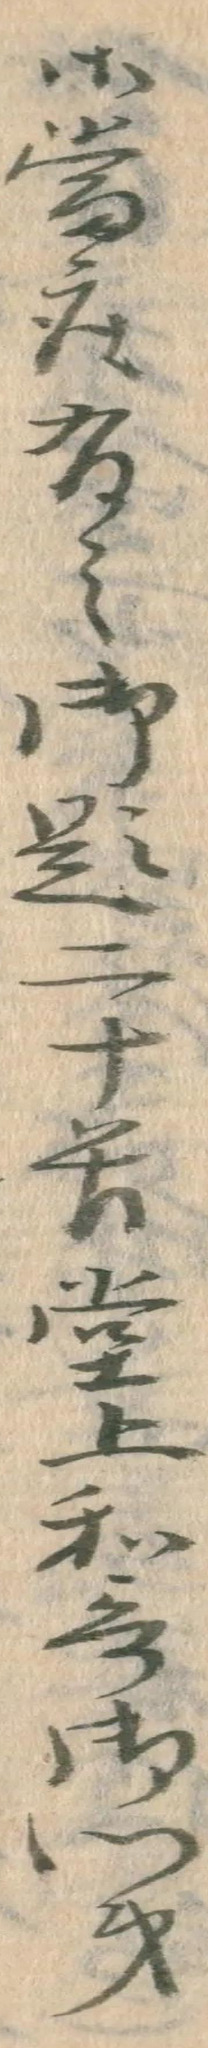御當座有之、御題二十首堂上和歌御門弟
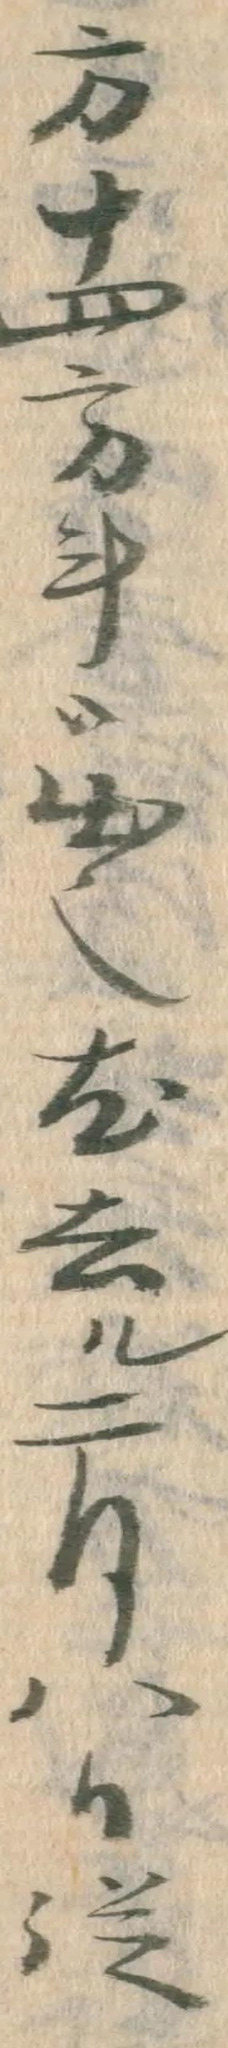方十四方斗御出也、尤去ル二月八日従
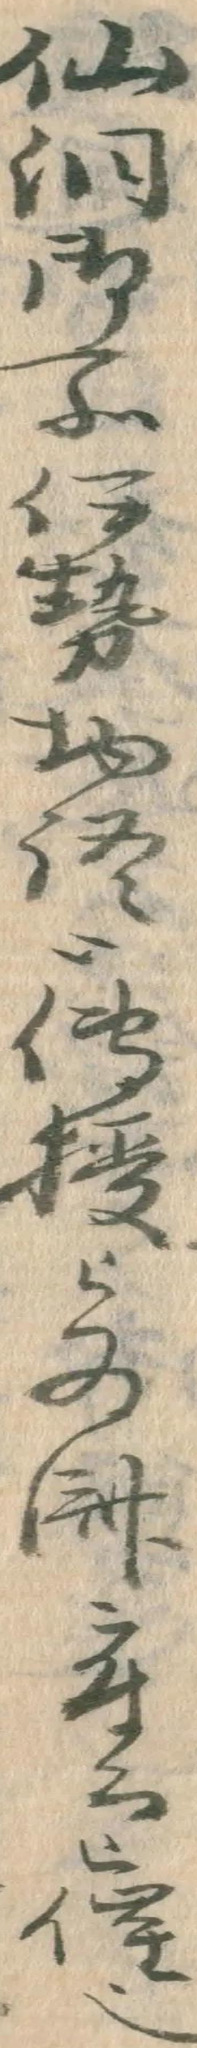仙洞御所伊勢物語御傳授被為済ニ付而被催也、
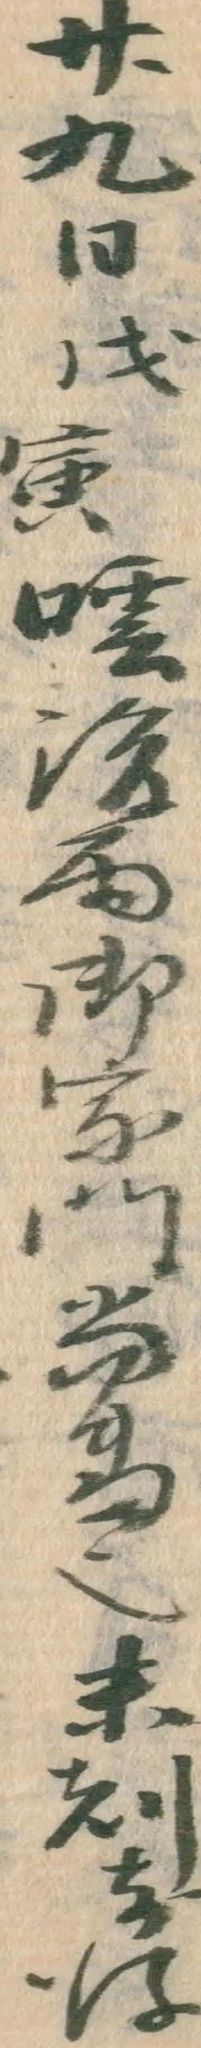廿九日戊寅晴後雨、御家門當番也、未刻前後
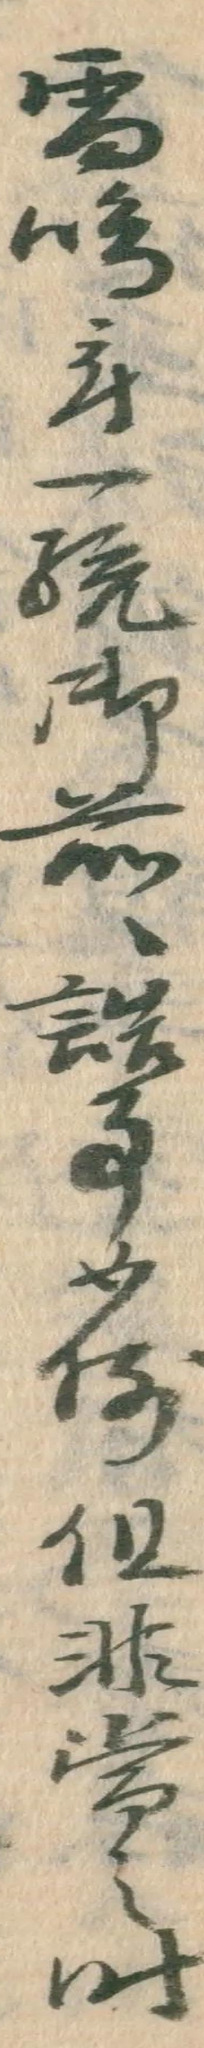雷鳴ニ付、一統御前へ詰事如例、但非常之時
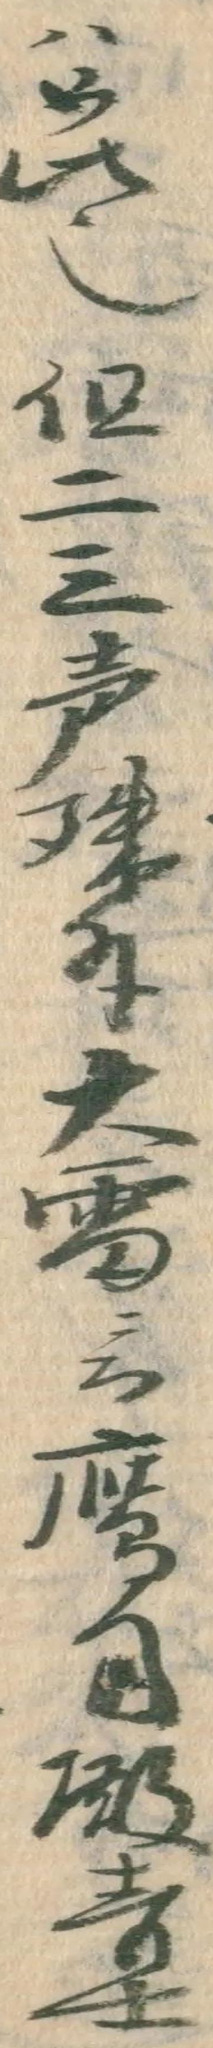ハ如此也、但二・三声殊外大雷ニ而、鷹司殿青士
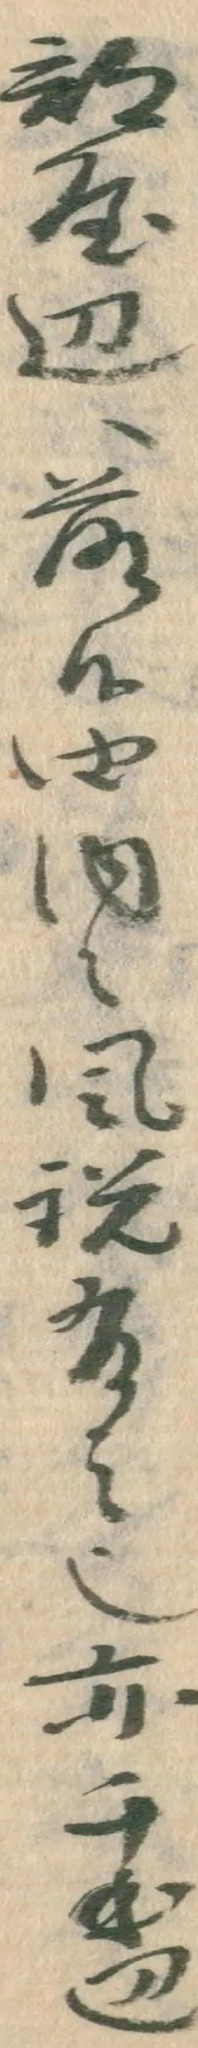部屋辺へ落候由、内々風説有之也、亦千本辺
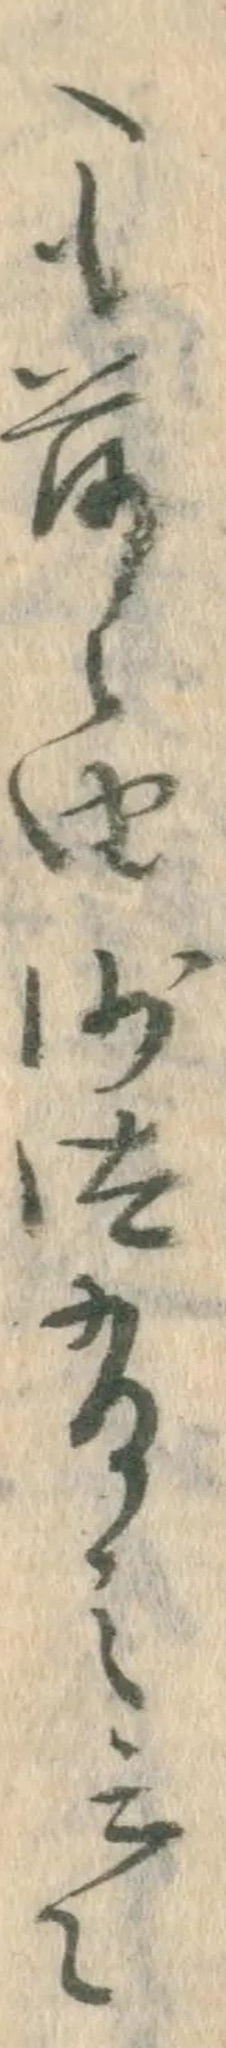へも落候由沙汰有之云々、
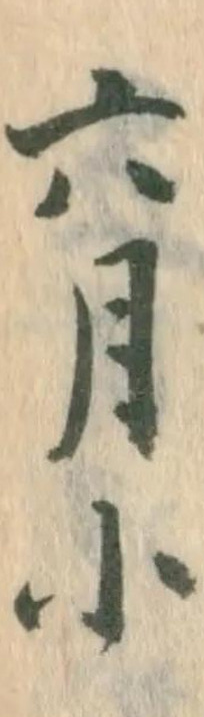六月小

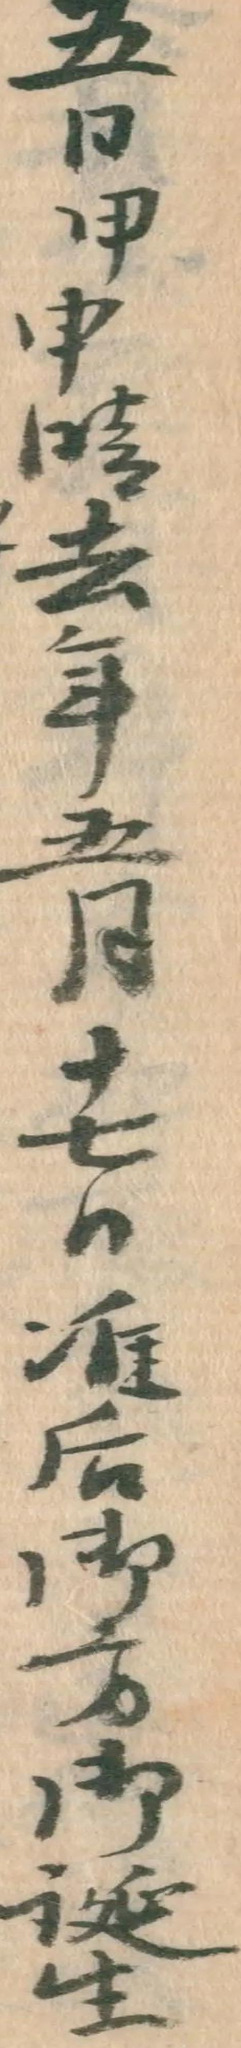五日甲申晴、去年五月十七日准后御方御誕生
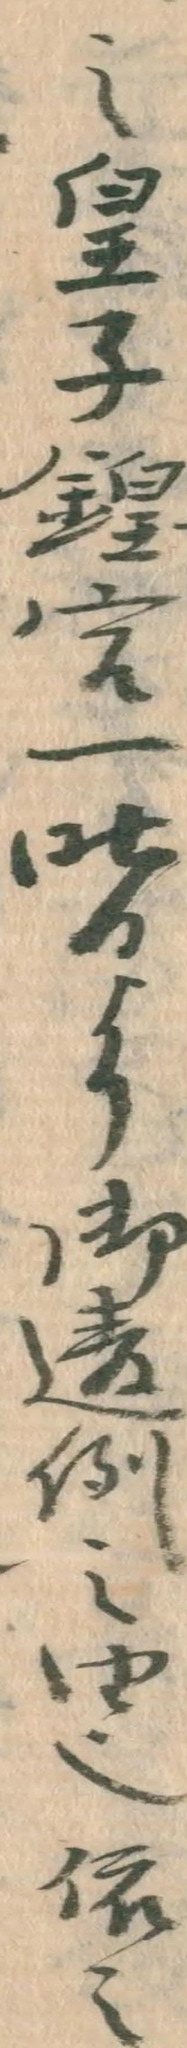之皇子、鍠宮一昨日より御違例之由也、依之
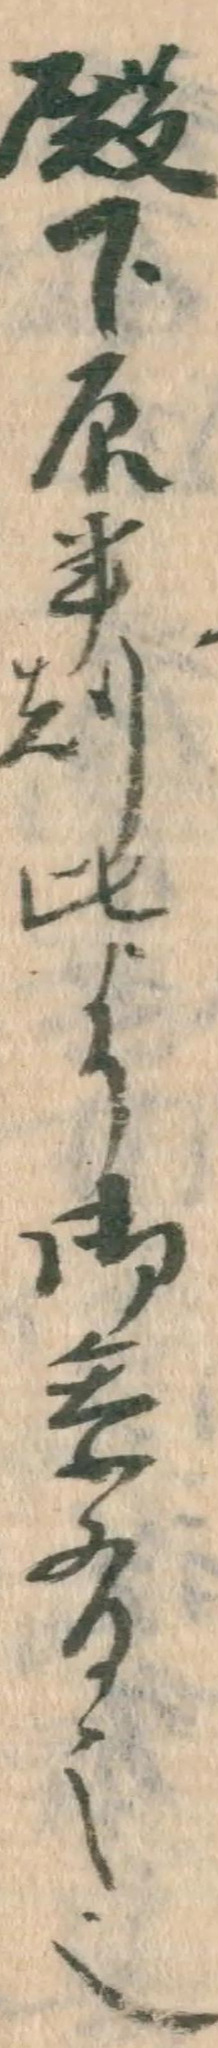殿下辰半刻比より御参有之也、
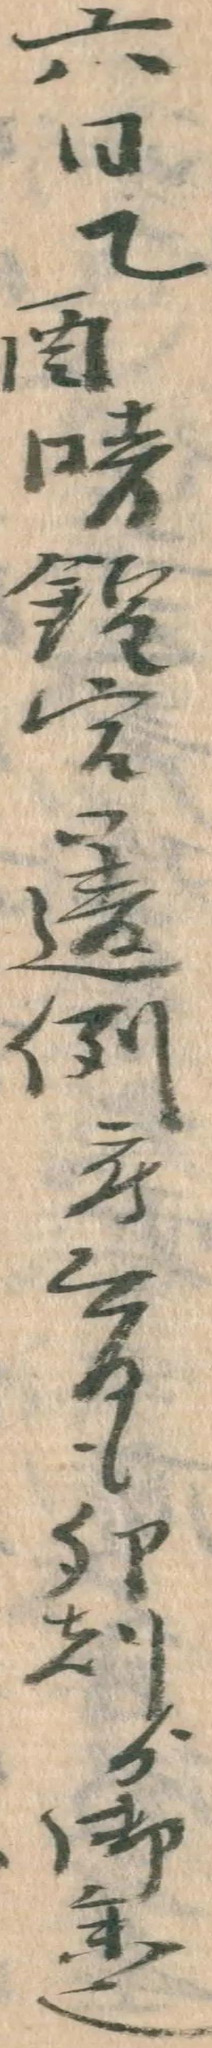六日乙酉晴、鍠宮御違例ニ付、今日も卯刻ゟ御参也、
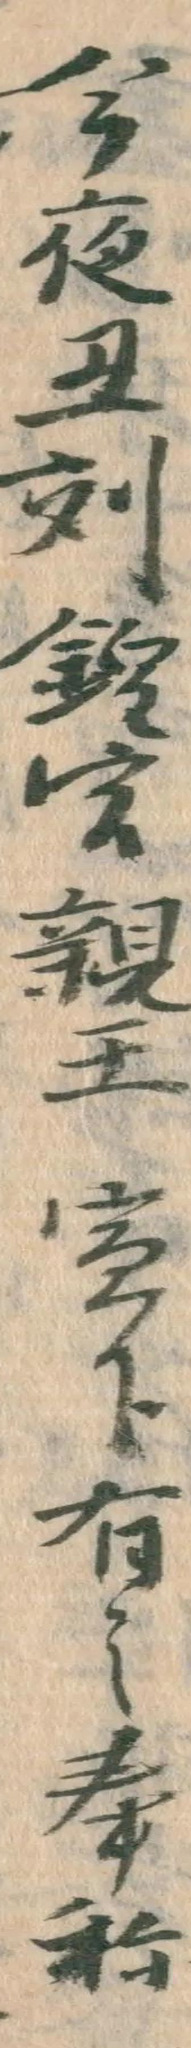今夜丑刻鍠官親王宣下有之、奉称
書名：賀茂社記録. 第63冊
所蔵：国立国会図書館 National Diet Library, JAPAN
